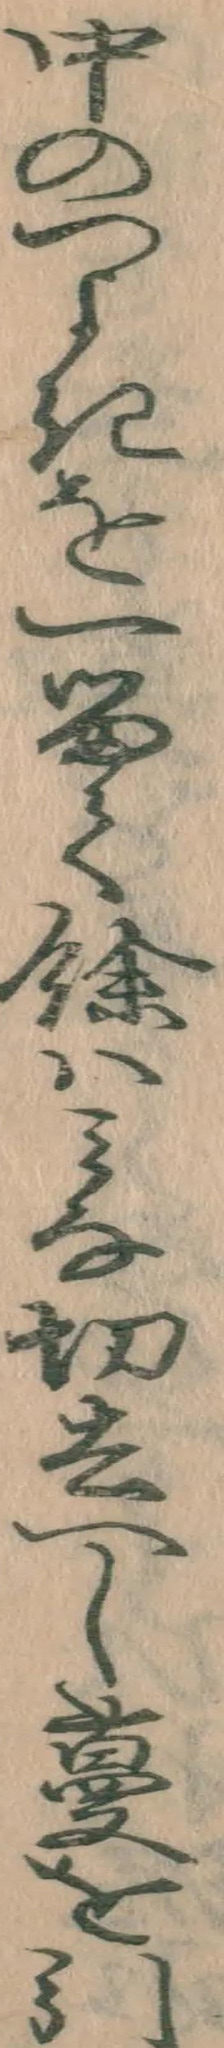中のつよきを一留て余はみな切去へし二子を留
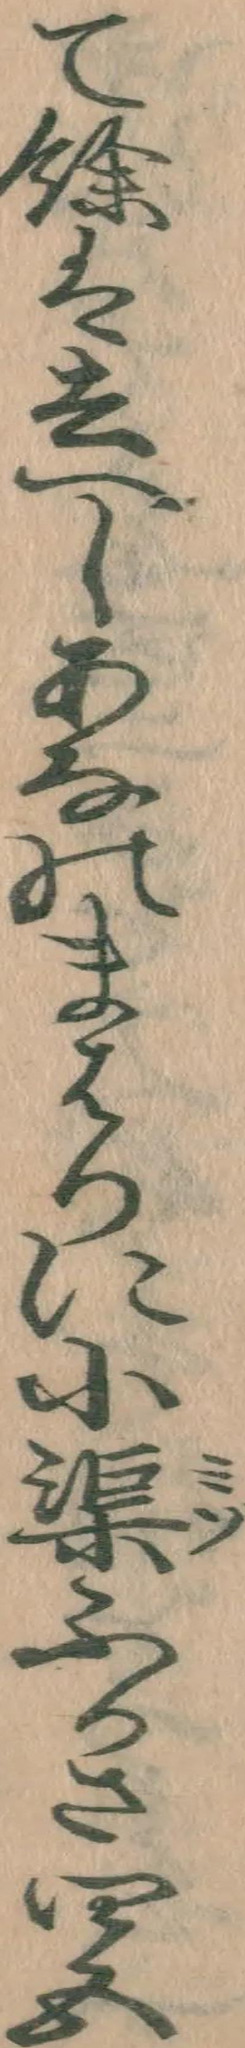て余は去へしあなのまはり小渠ふかさ四五
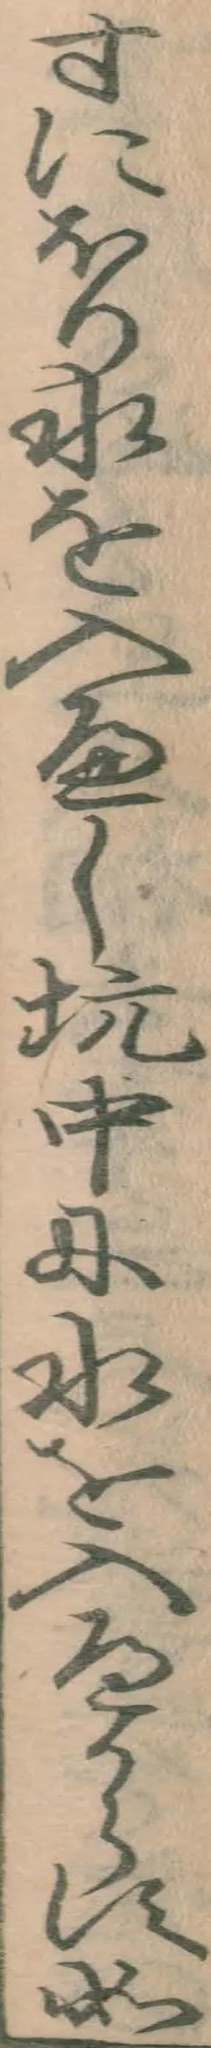寸にほり水を入へし坑中に水を入へからす如
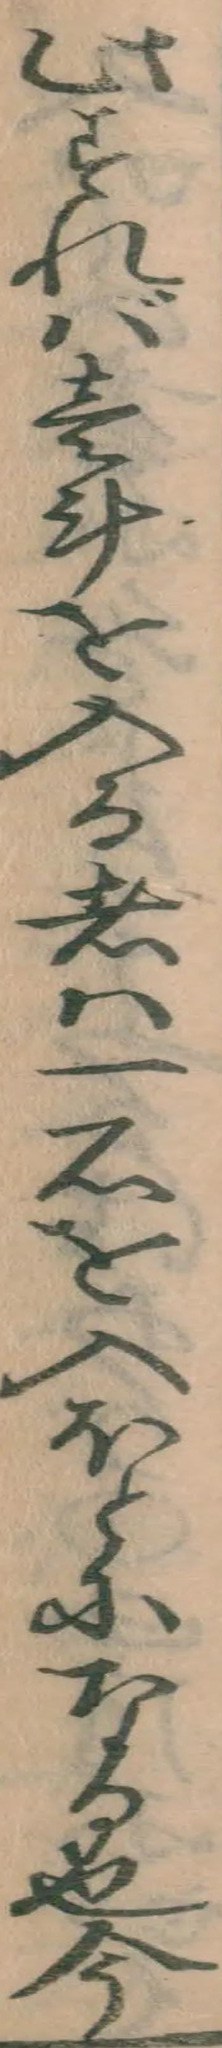此すれば壱斗を入る者は一石を入ほとになる也今
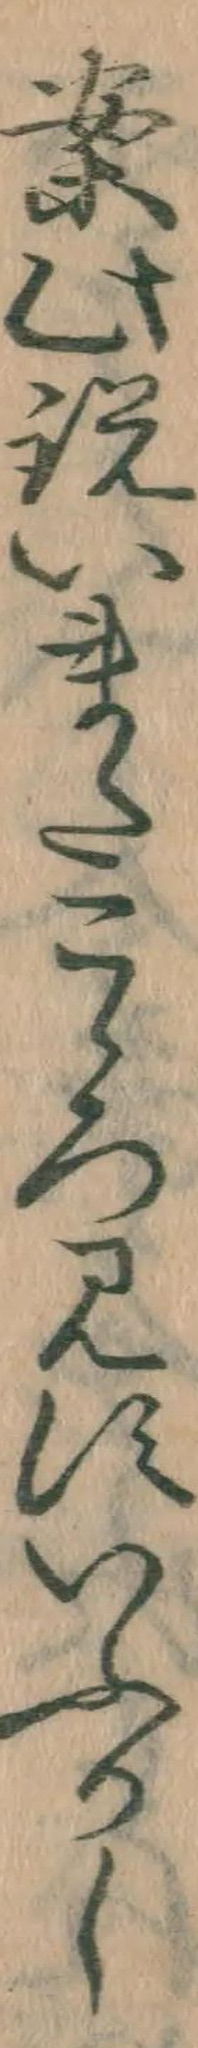案此説いまたこゝろみすいふかし
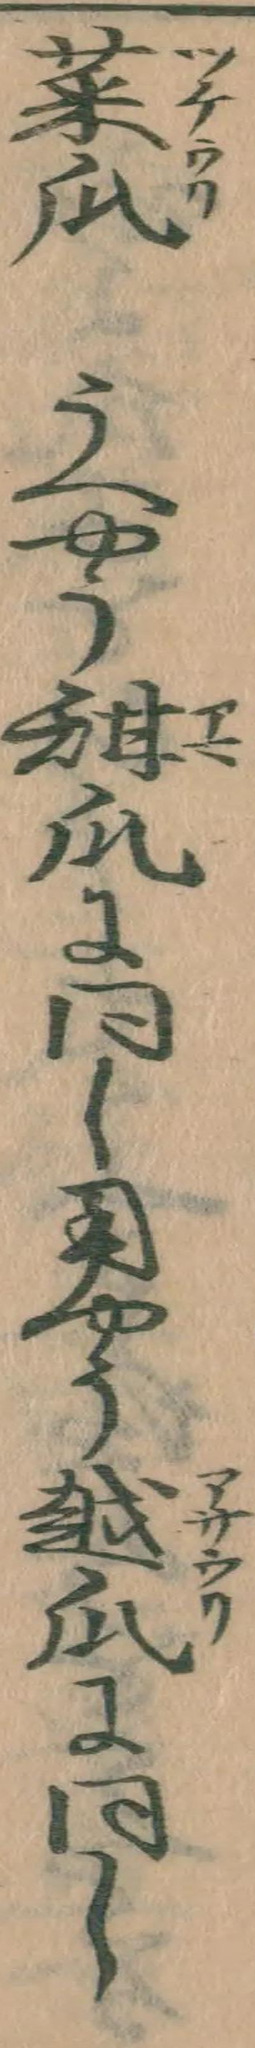菜瓜うへやう甜瓜に同し用やう越瓜に同し
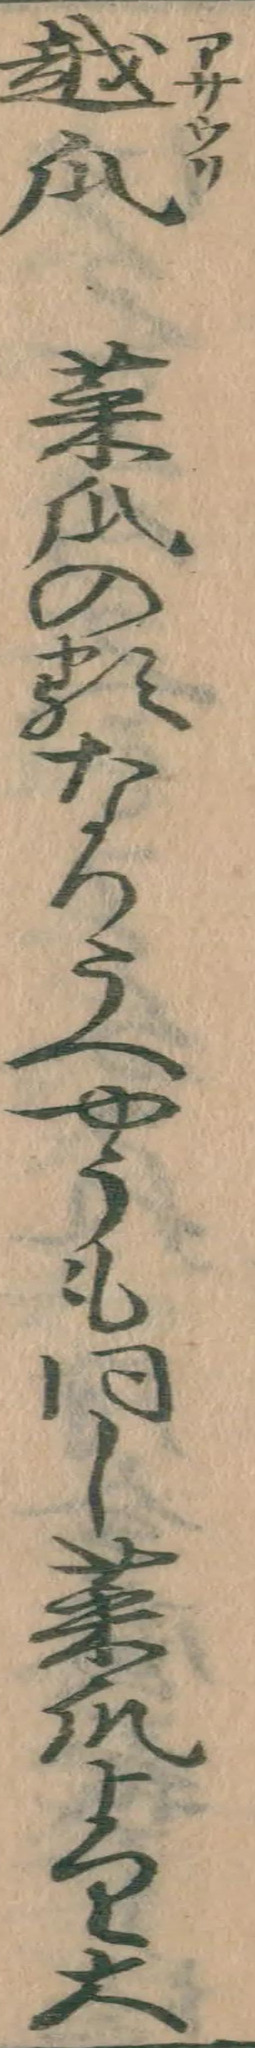越瓜菜瓜の類なりうへやうも同し菜瓜より大
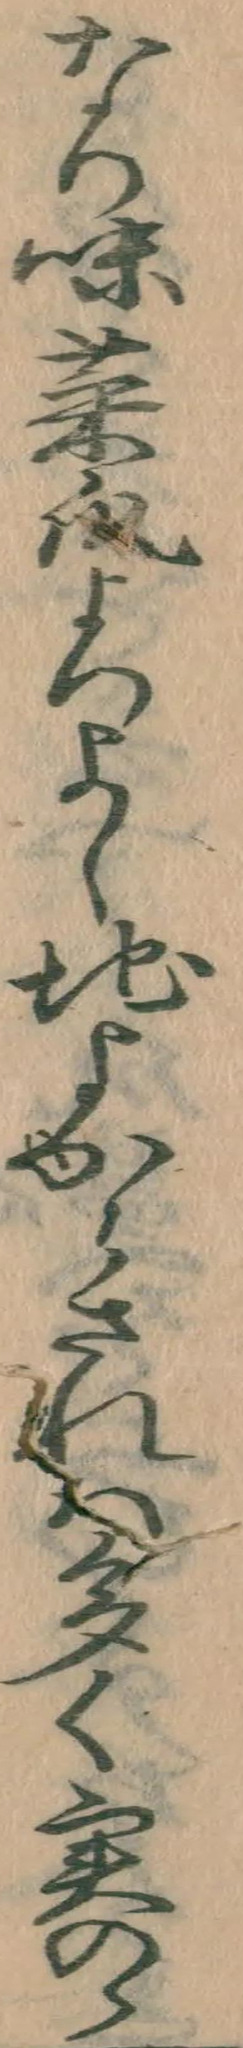なり味菜瓜よりよし地よからされは多く実のら
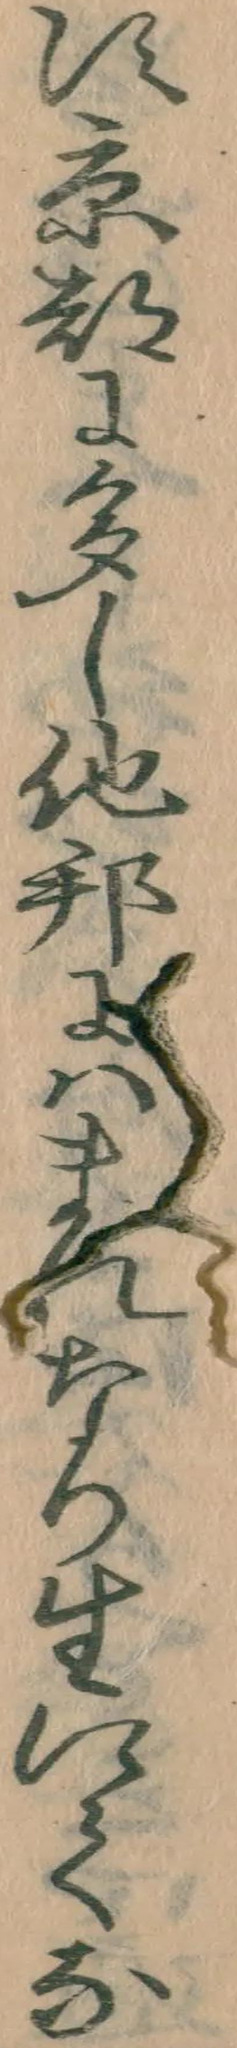す京都に多し他邦にはまれなり生にてな
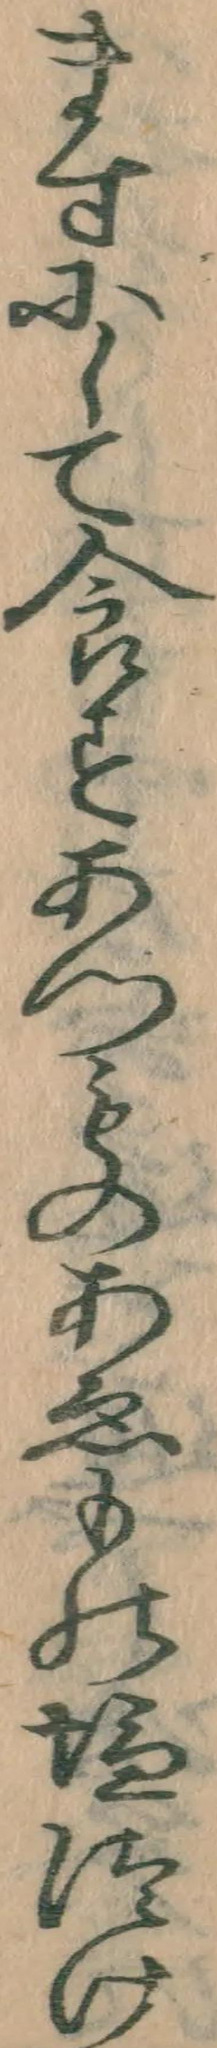ますにして食すあつものあゑもの塩つけ
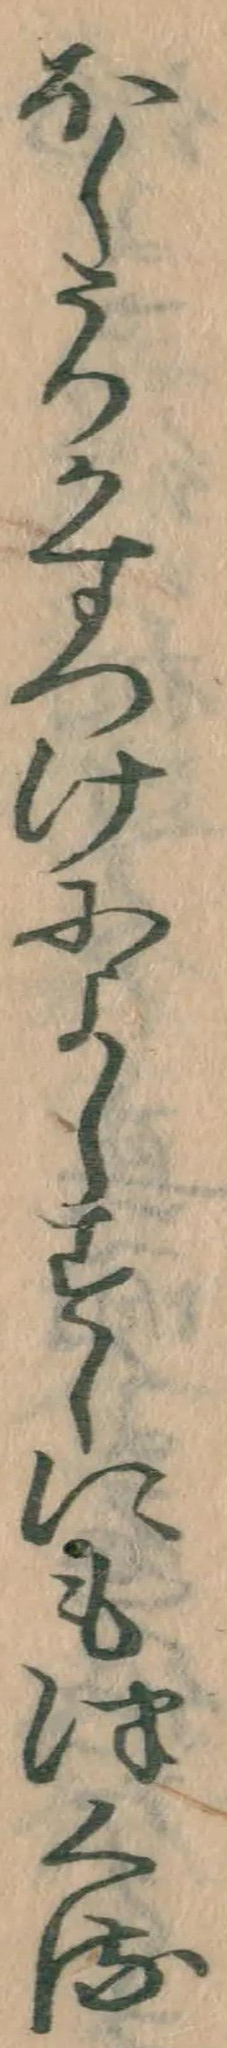ほしうりかすつけによしすしにもつくる
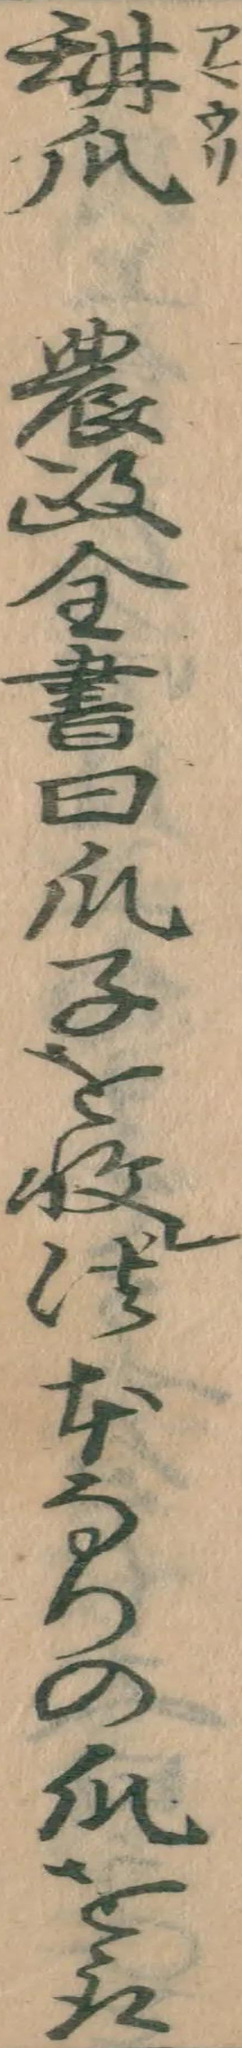甜瓜農政全書曰瓜子を収法本なりの瓜を取
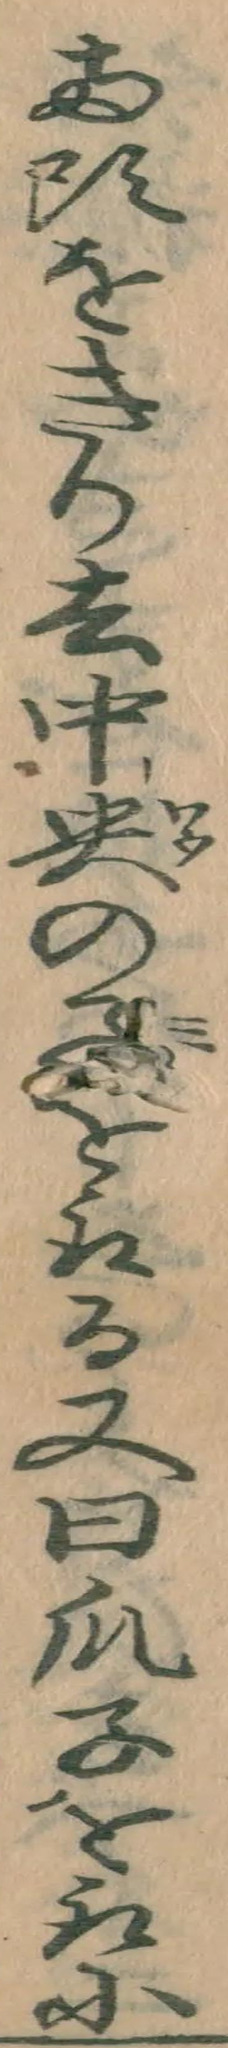両頭をきり去中央の子を取る又曰瓜子を取に

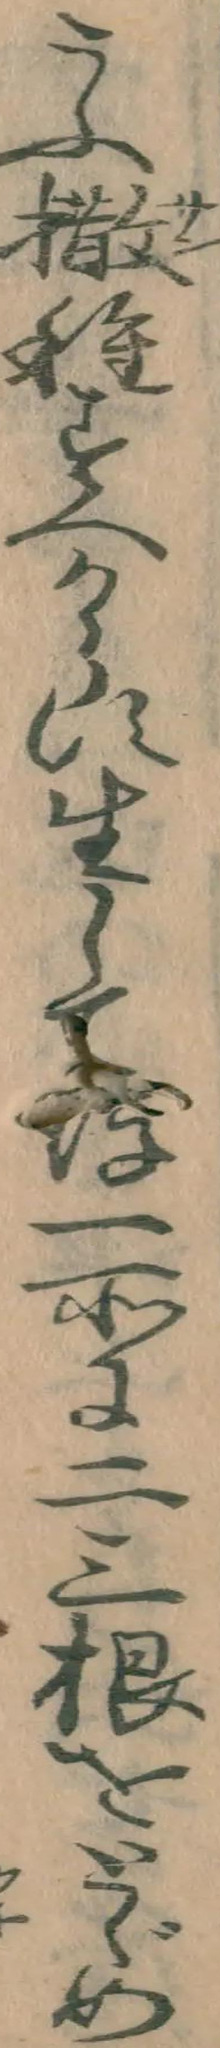うふ散種すへからす生して後一所に二三根をとゞね
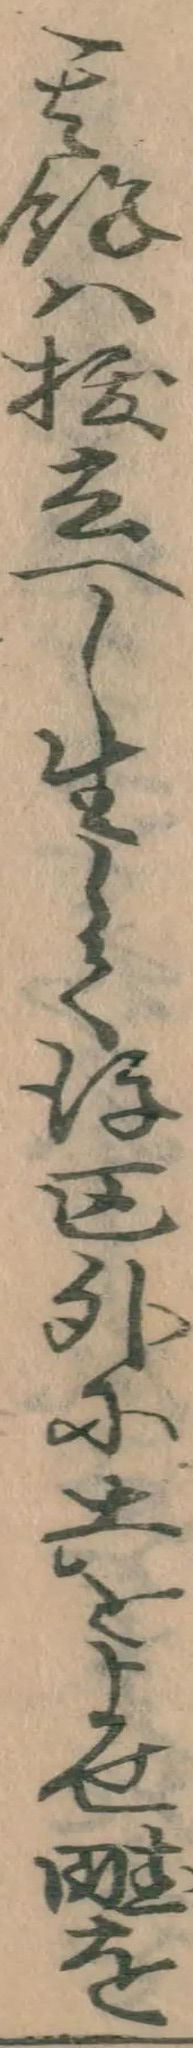其余は抜去へし生して後区外に土をよせ畦を
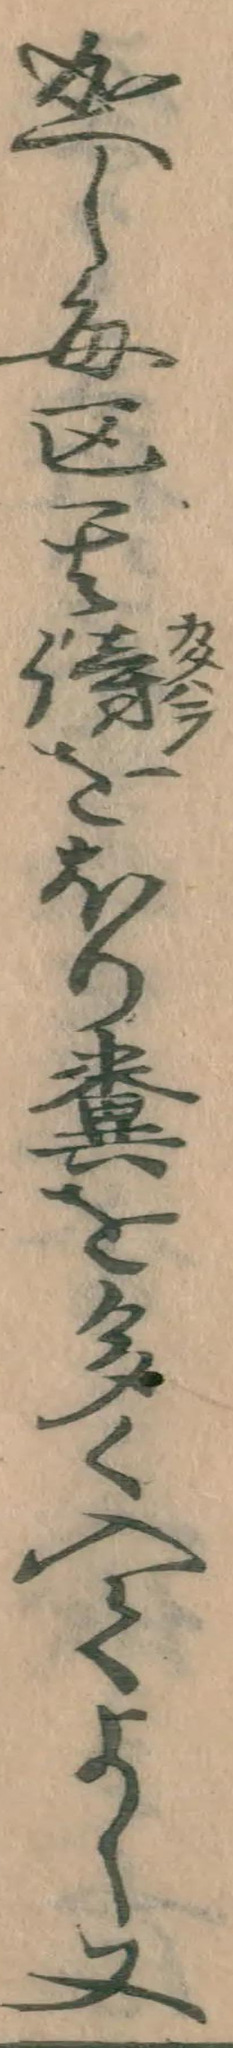成へし毎区其侍をほり糞を多く入てよし又
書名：菜譜 3巻
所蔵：国立国会図書館 National Diet Library, JAPAN
